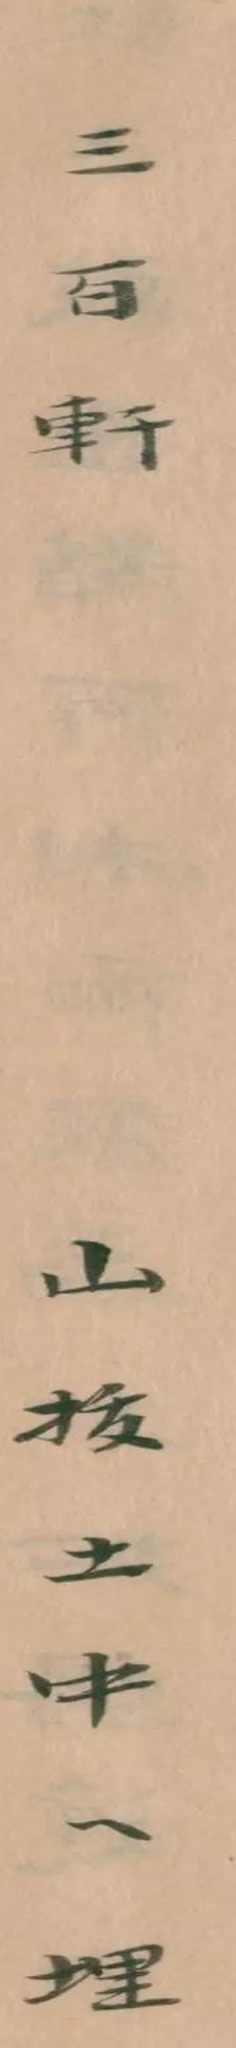三百軒山抜土中ヘ埋
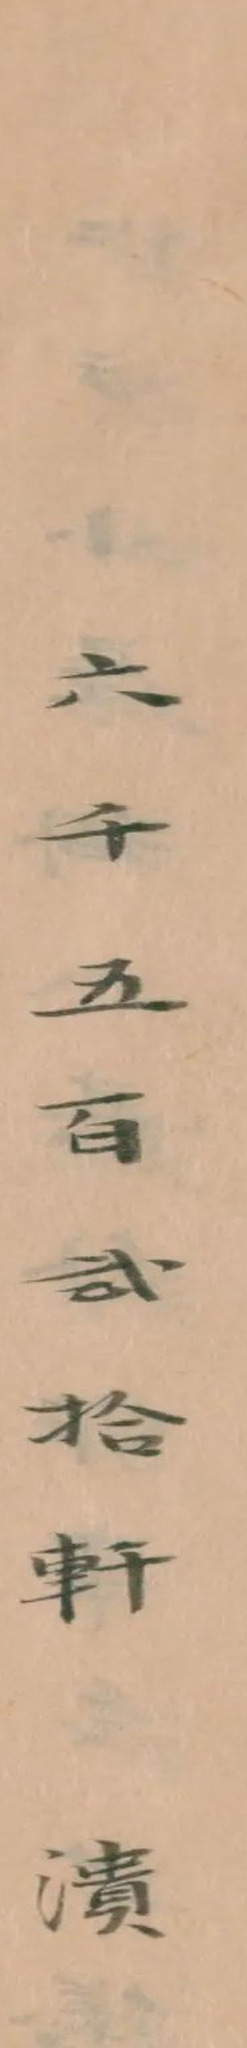六千五百弐拾軒潰
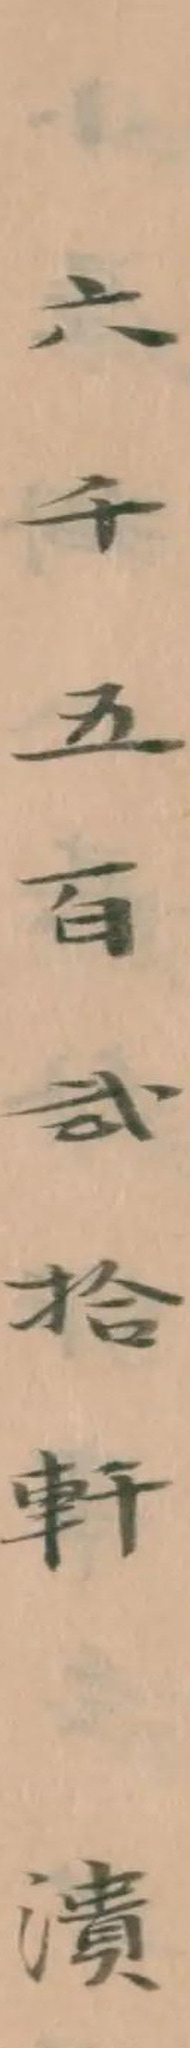六千五百弐拾軒潰
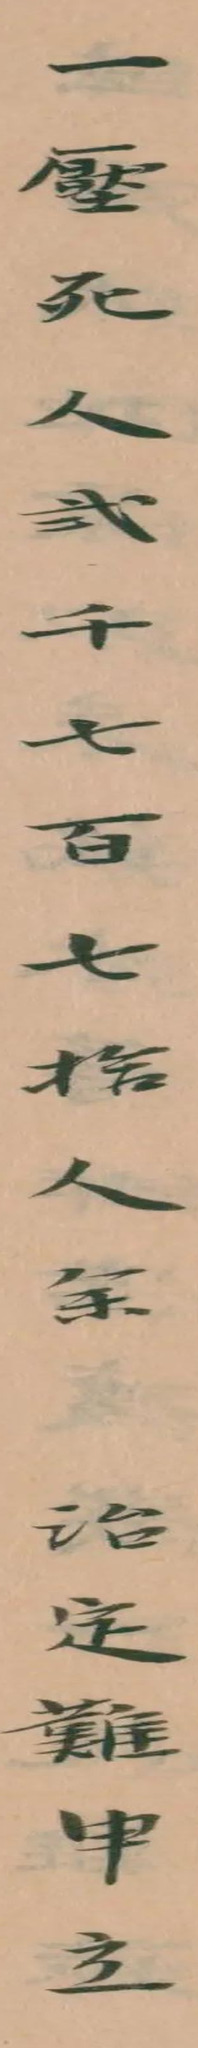一圧死人弐千七百七拾人余治定難申立
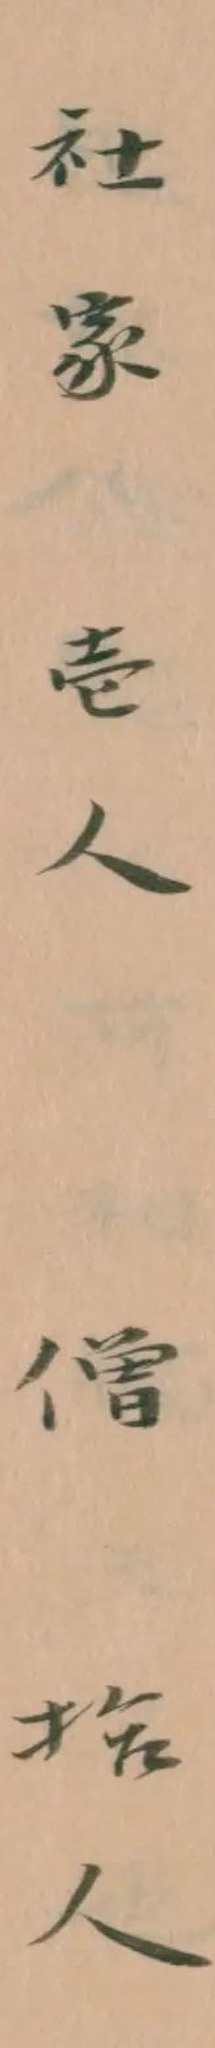社家壱人僧拾人
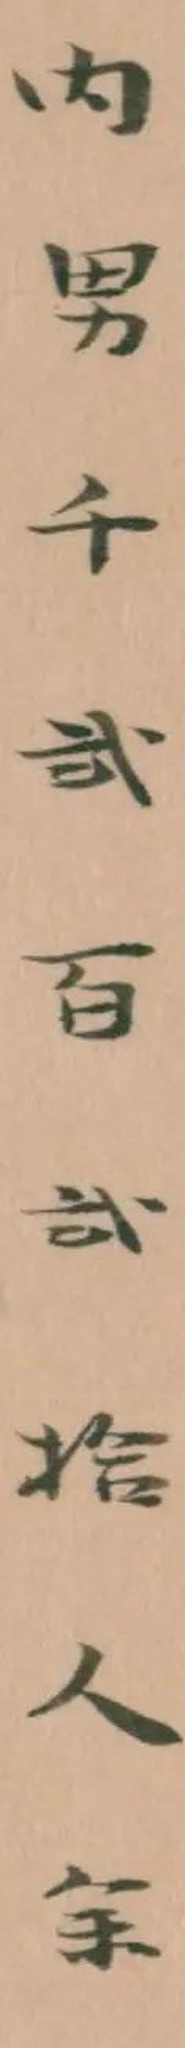内男千弐百弐拾人余
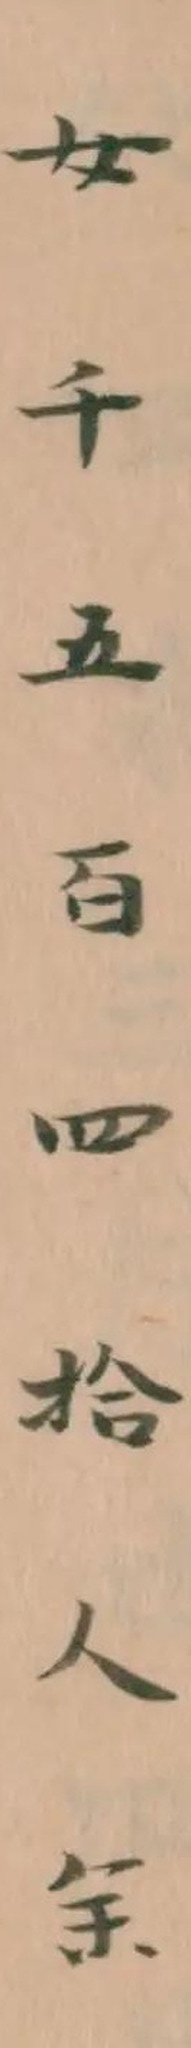女千五百四拾人余
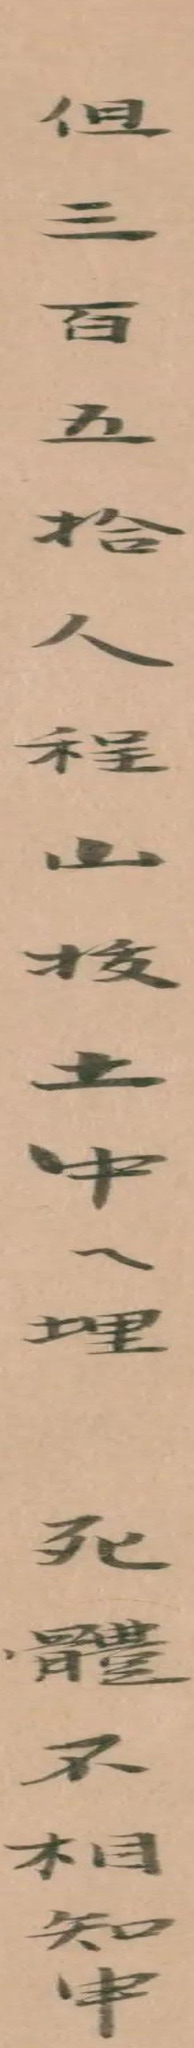但三百五拾人程山抜土中ヘ埋死体不相知申
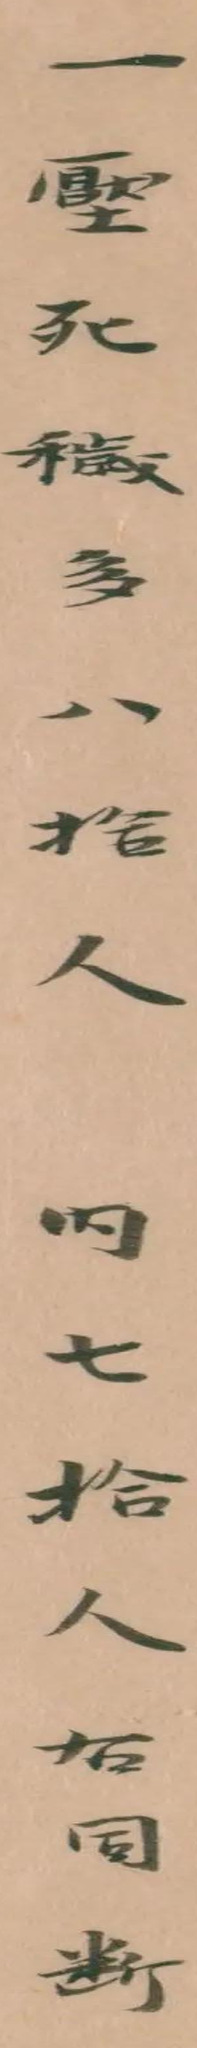一圧死穢多八拾人内七拾人右同断
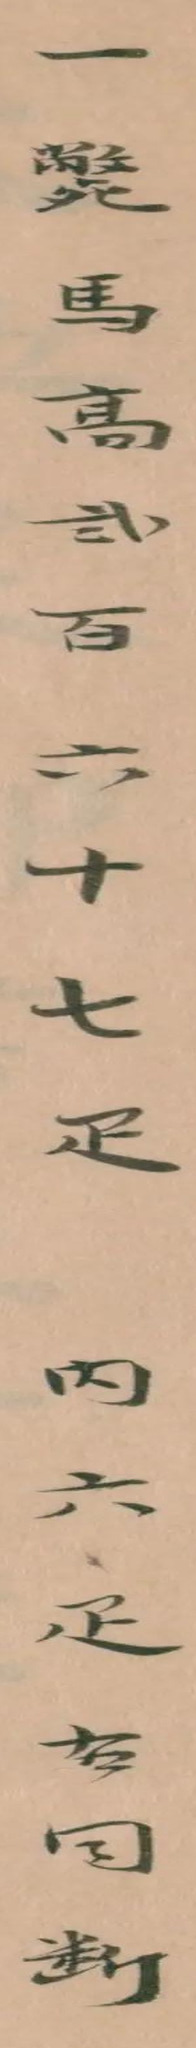一斃馬高弐百六十七疋内六疋右同断
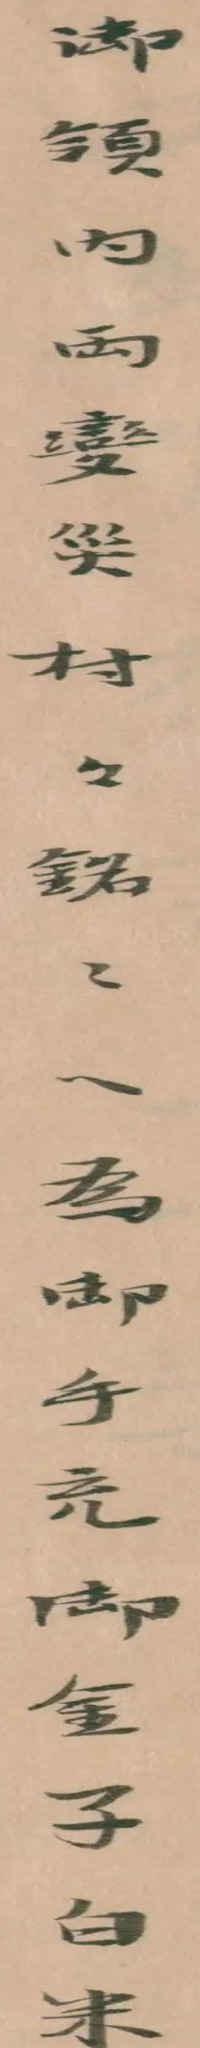御領内両変災村々銘々ヘ為御手充御金子白米
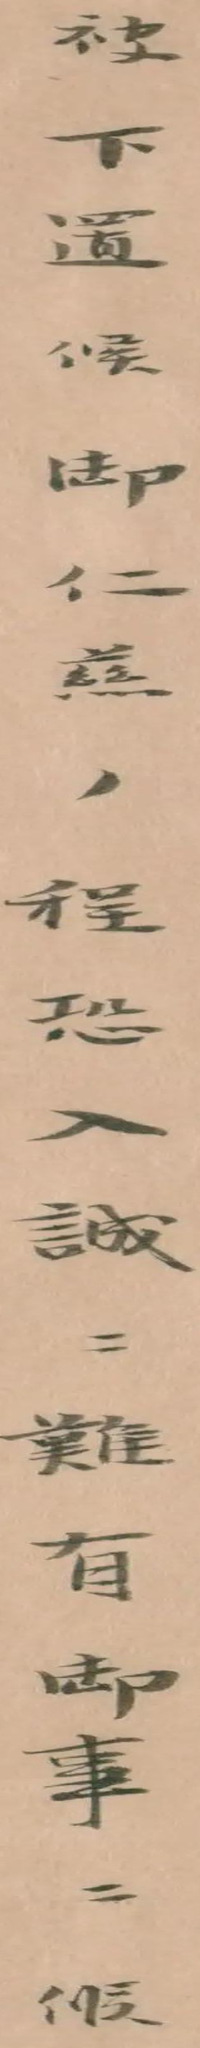被下置候御仁慈ノ程恐入誠ニ難有御事ニ候

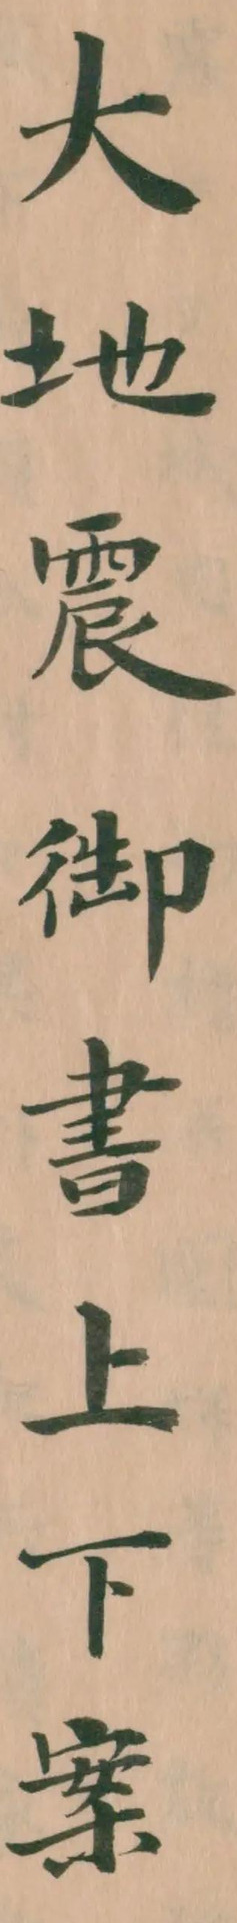大地震御書上下案
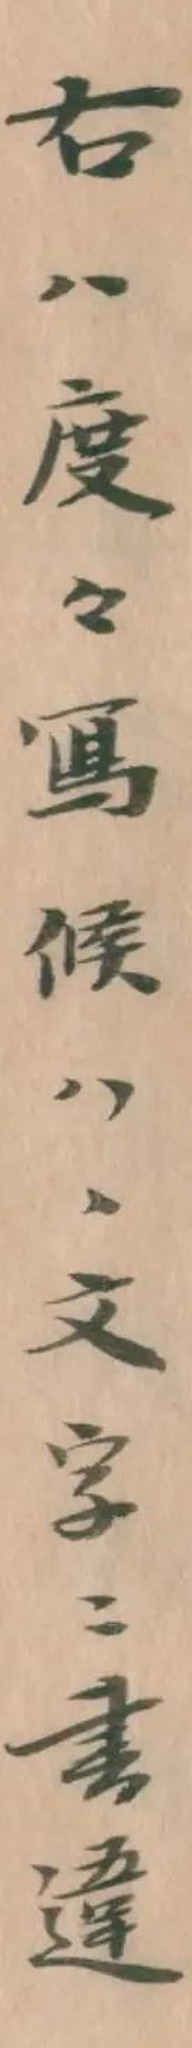右ハ度々写候ハヽ文字ニ書違
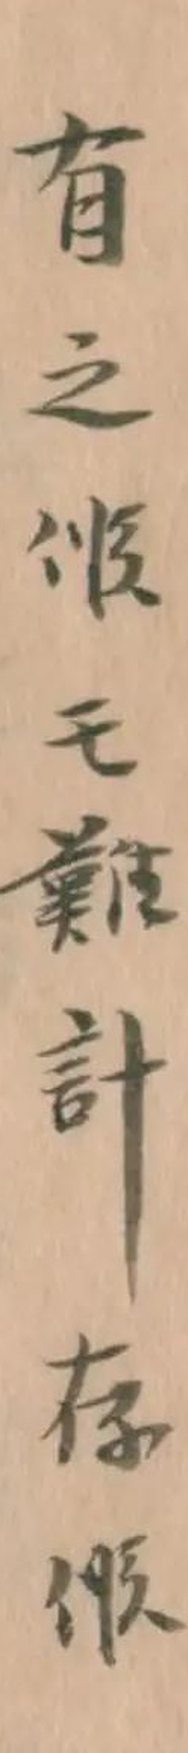有之候モ難計存候

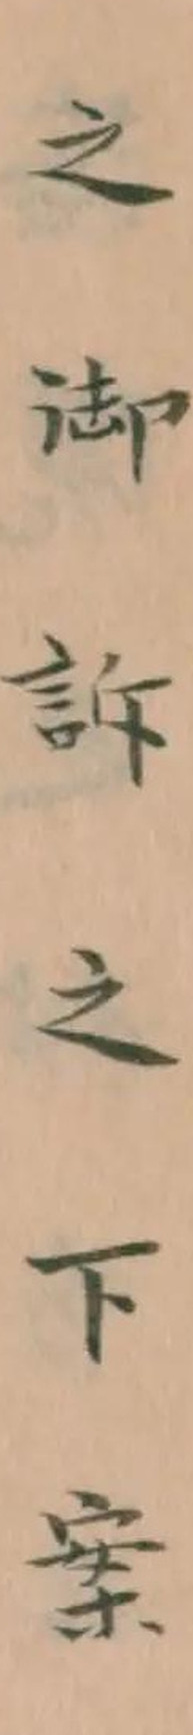之御訴之下案
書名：地災撮要. 巻5-6(地震之部)
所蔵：国立国会図書館 National Diet Library, JAPAN
